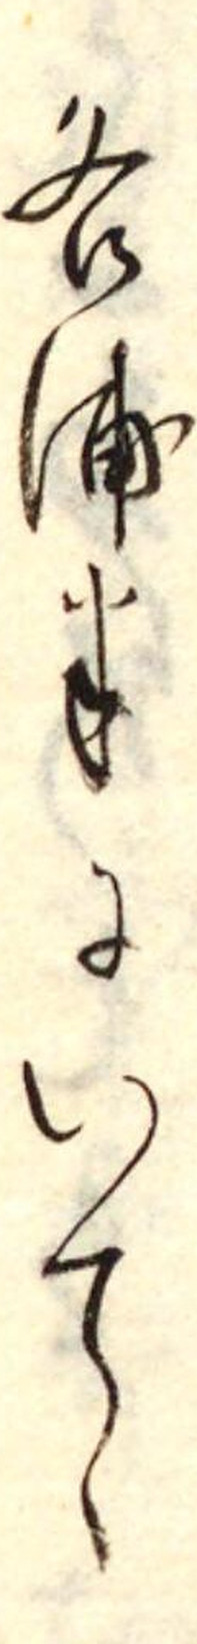各浦はにいてゝ
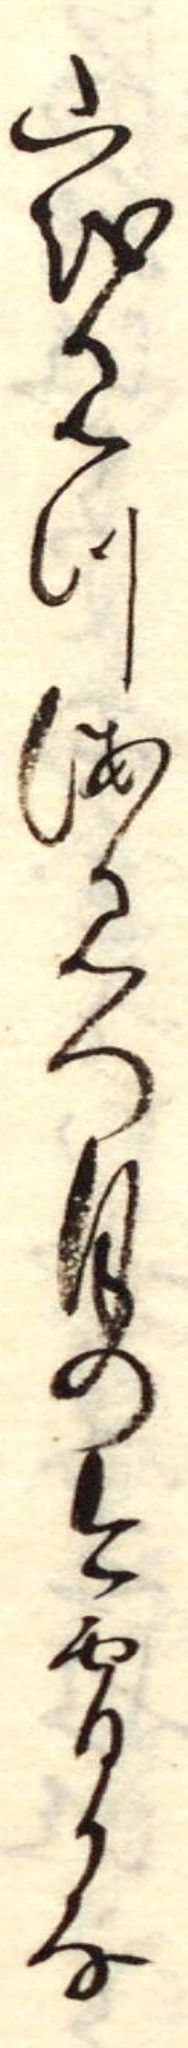山を見つ海見つ月の今宵かな
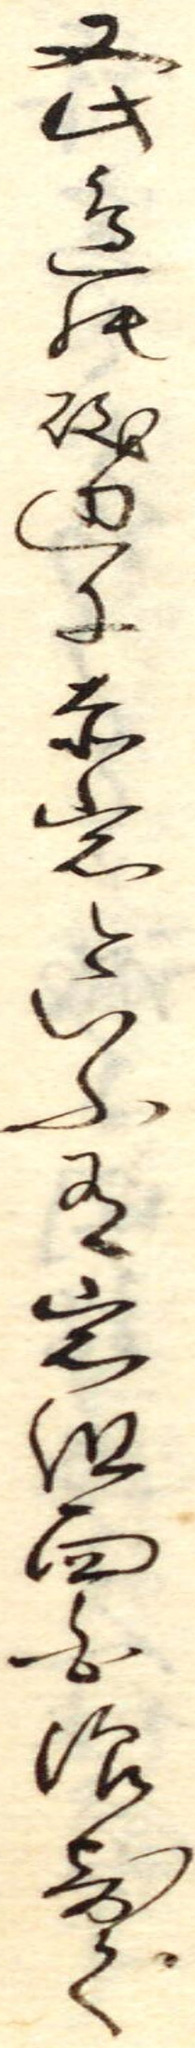又此辺の磯辺に赤岩といふ有岩組面白浪寄て
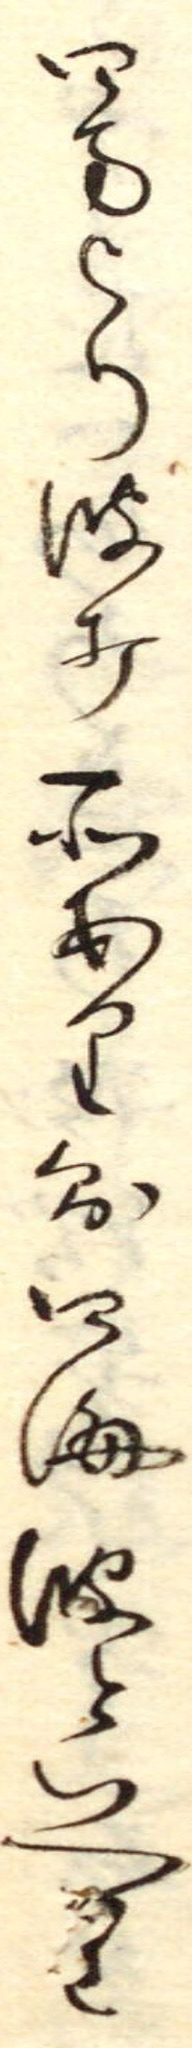四方より波打所あり則四海波といへり
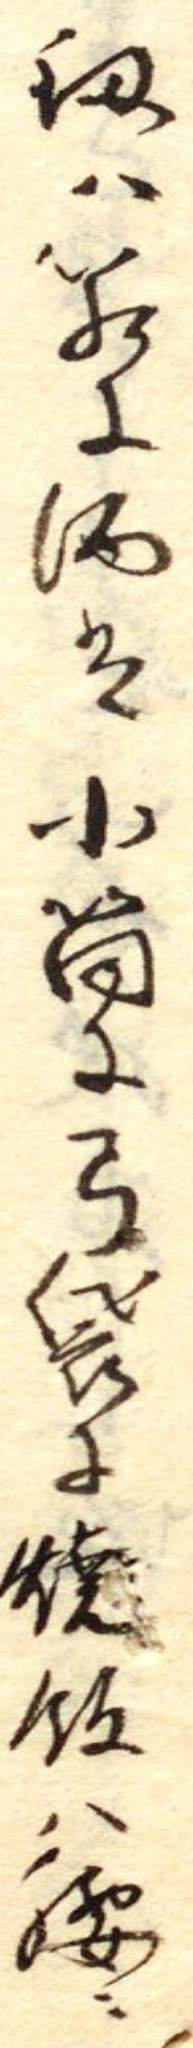釼は箱に酒は小筒に弓は袋に焼飯は腰に
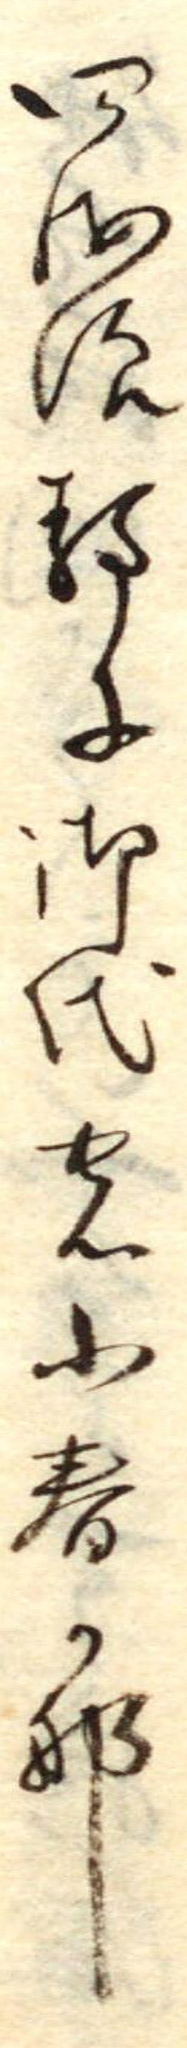四海浪静に御代の小春かな
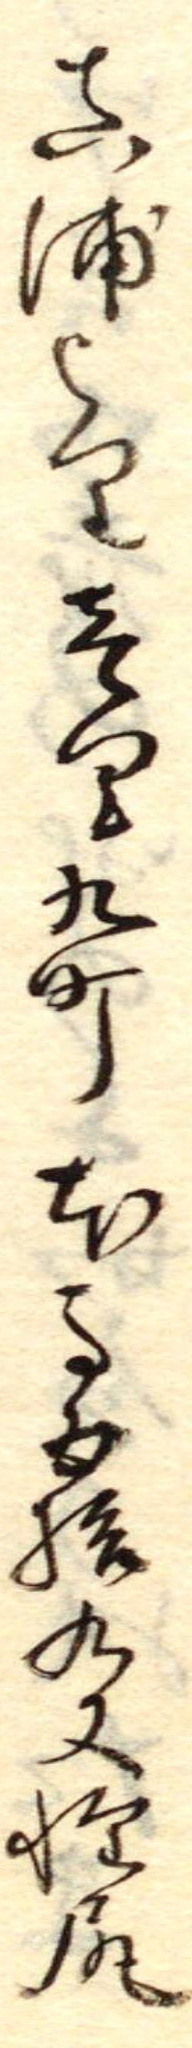真浦より壱里九町本馬五拾九文軽尻
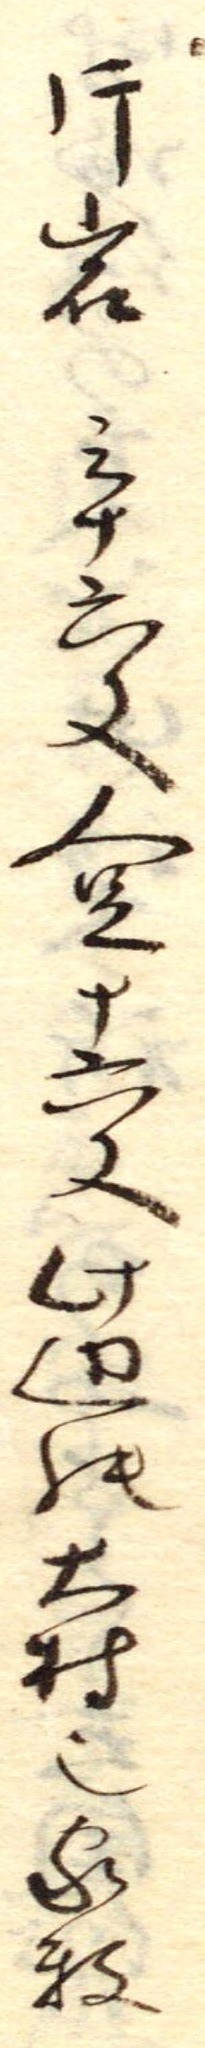片岩三十六文人足十六文此辺の大村也家数
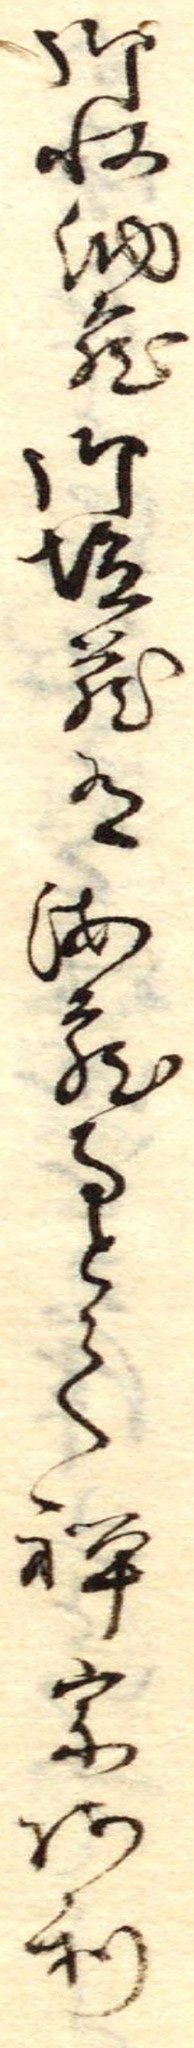御収納蔵御塩蔵有海蔵寺とて禅宗あり
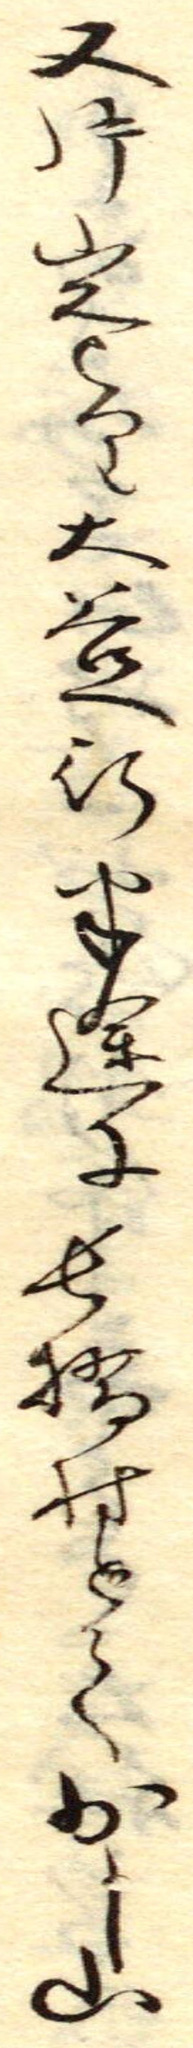又片岩より大谷へ行半途に長橋村とて少し山

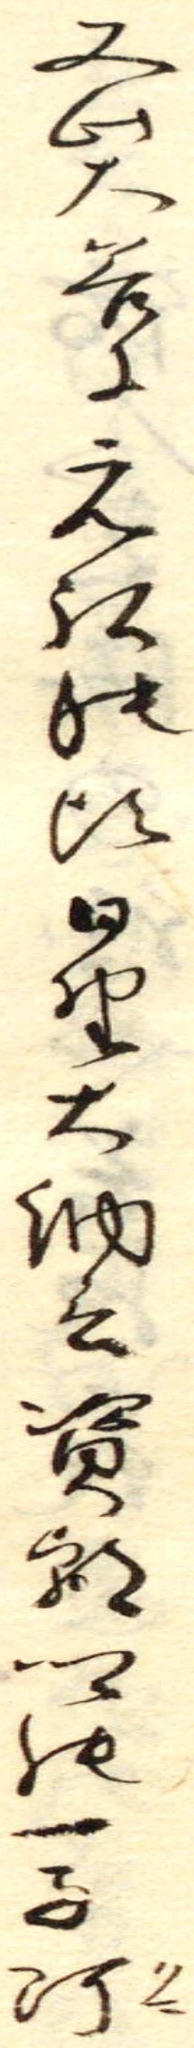又此大谷に元弘の頃日野大納言資朝卿の一子阿
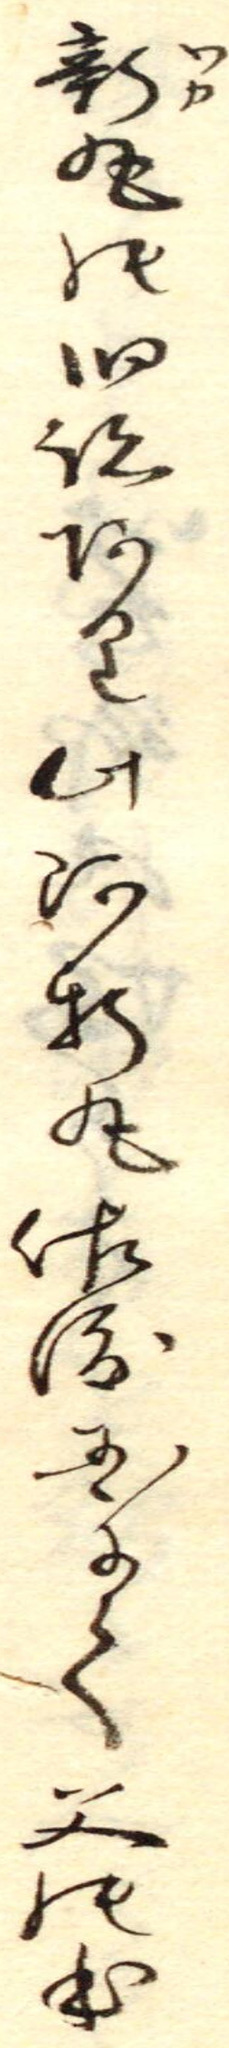新丸の旧跡あり此阿新丸佐渡国にて父の本
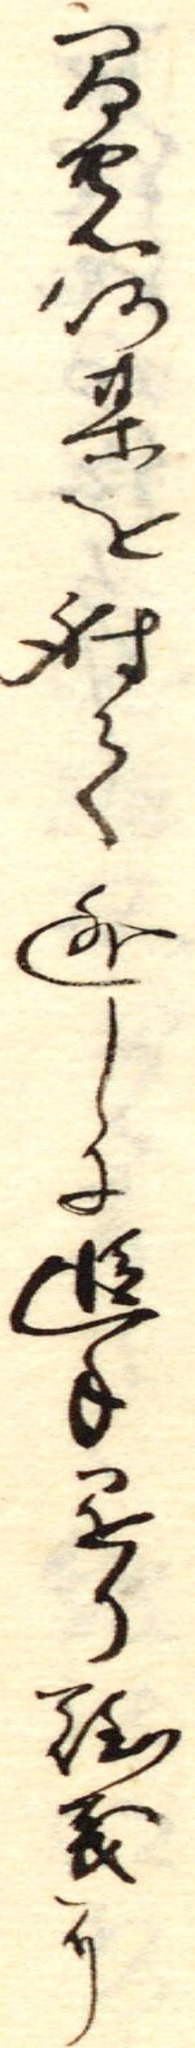間の何某を射て逃しに追手懸り難義に
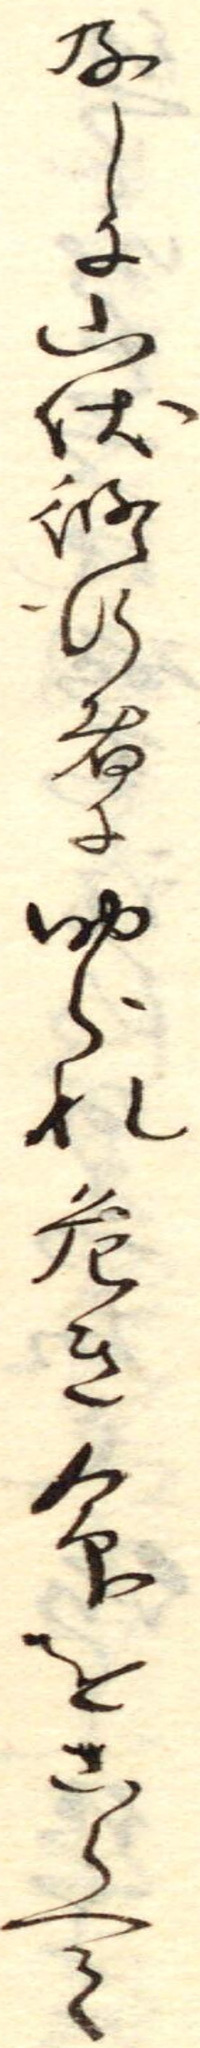及しに山伏修行者に助られ危き命をこらへて
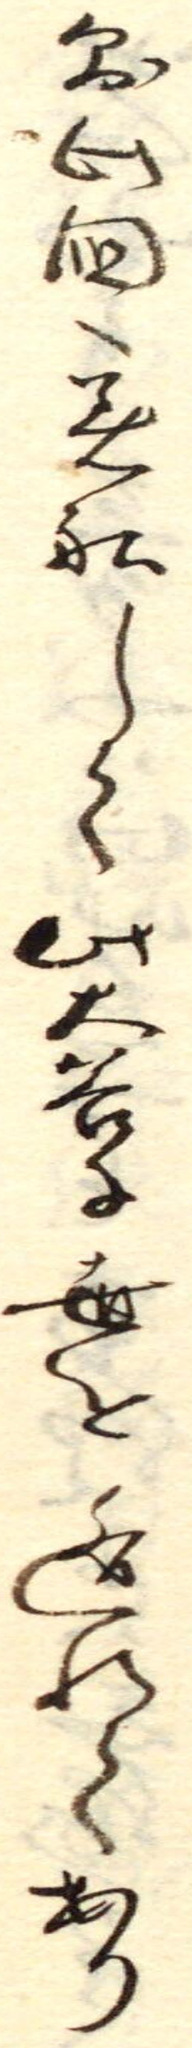則此国へ着船して此大谷に世を遁れてあり
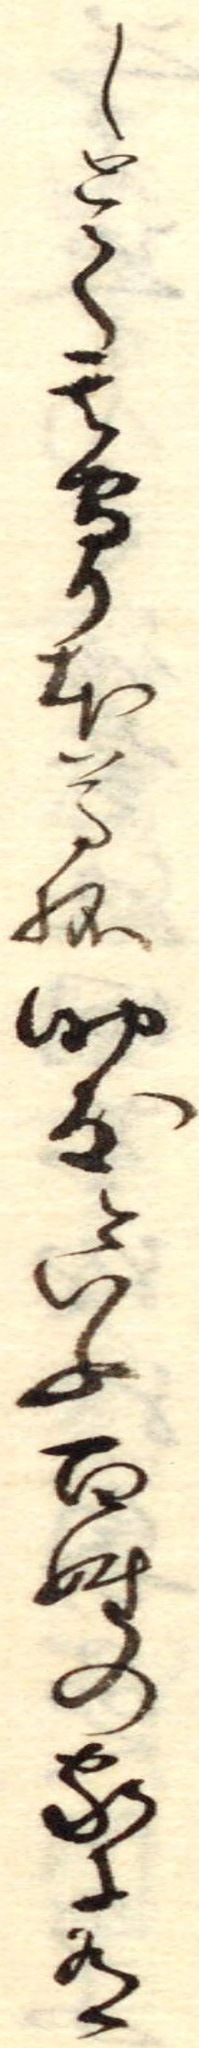しとて其守り本尊抔助度といふ百姓の家に有
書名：能登名跡誌
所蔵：Ishikawa Prefectural Library
